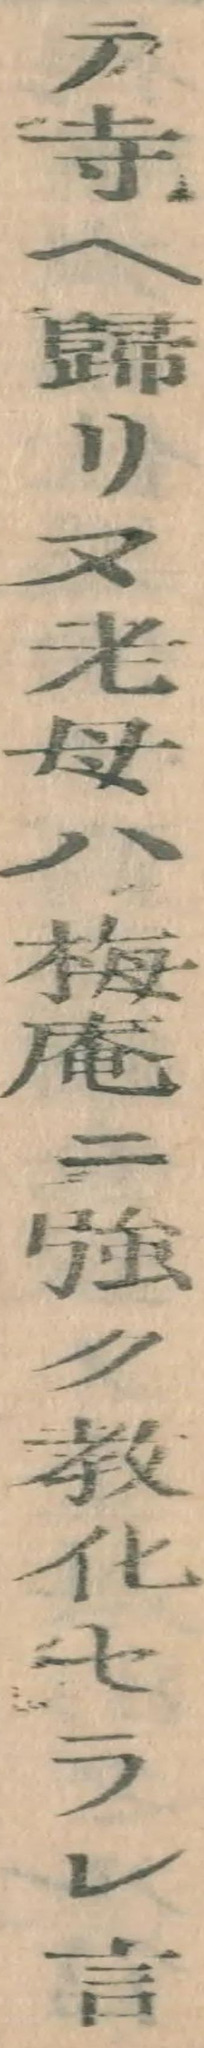テ寺ヘ帰リヌ老母ハ梅庵ニ強ク教化セラレ言
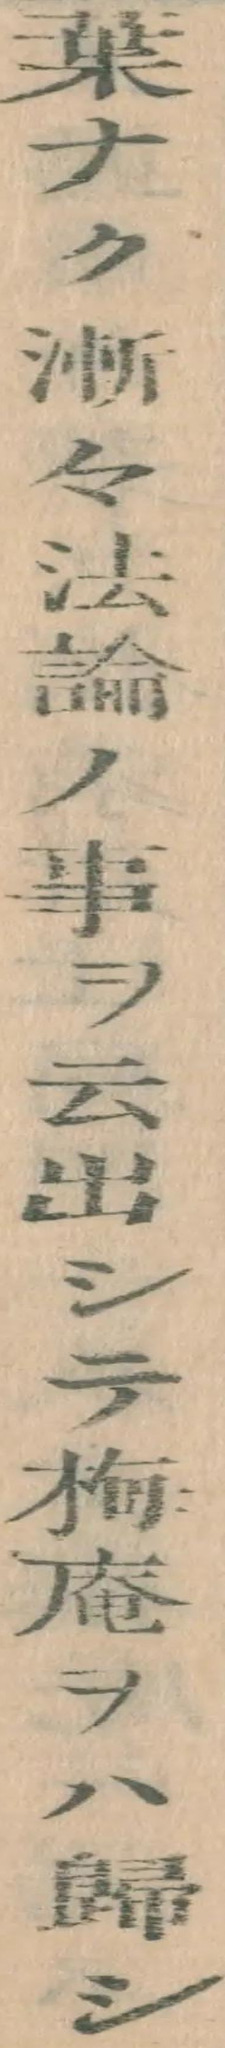葉ナク漸々法論ノ事ヲ云出シテ梅庵ヲハ帰シ
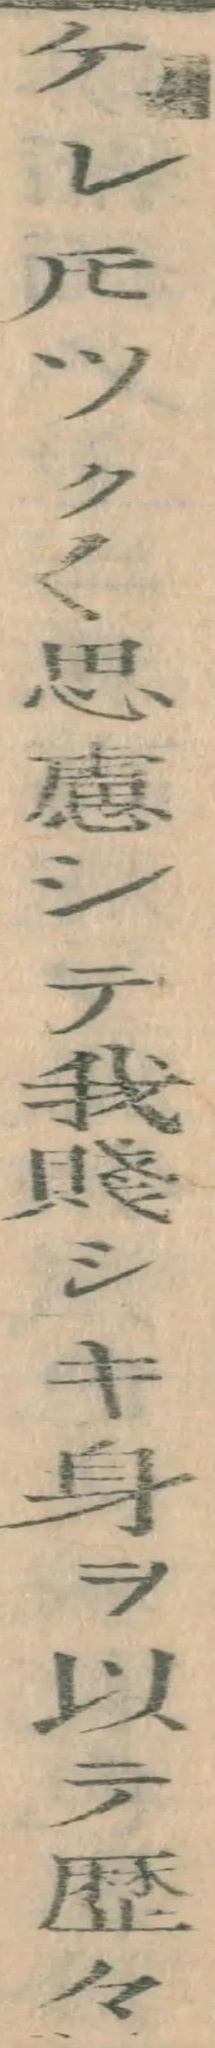ケレトモツク〳〵思慮シテ我賤シキ身ヲ以テ歴々
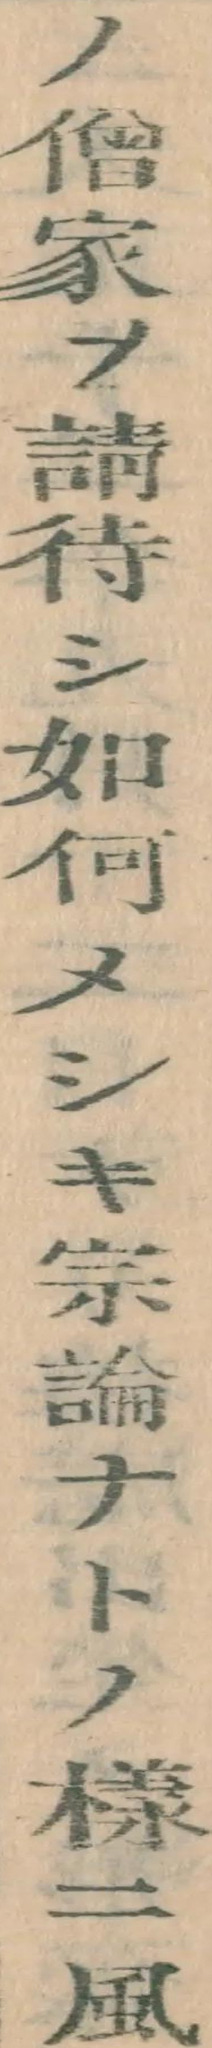ノ僧家ヲ請待シ如何メシキ宗論ナトノ様ニ風
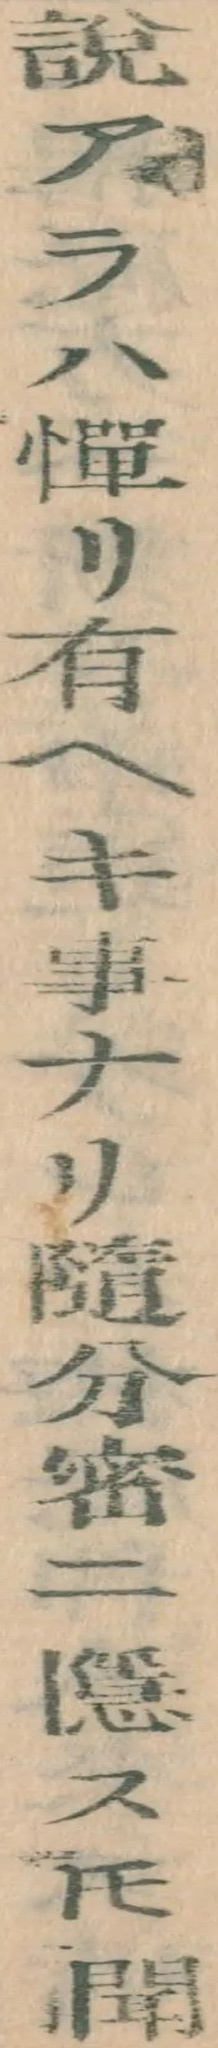説アラハ憚リ有ヘキ事ナリ随分密ニ隠ストモ聞
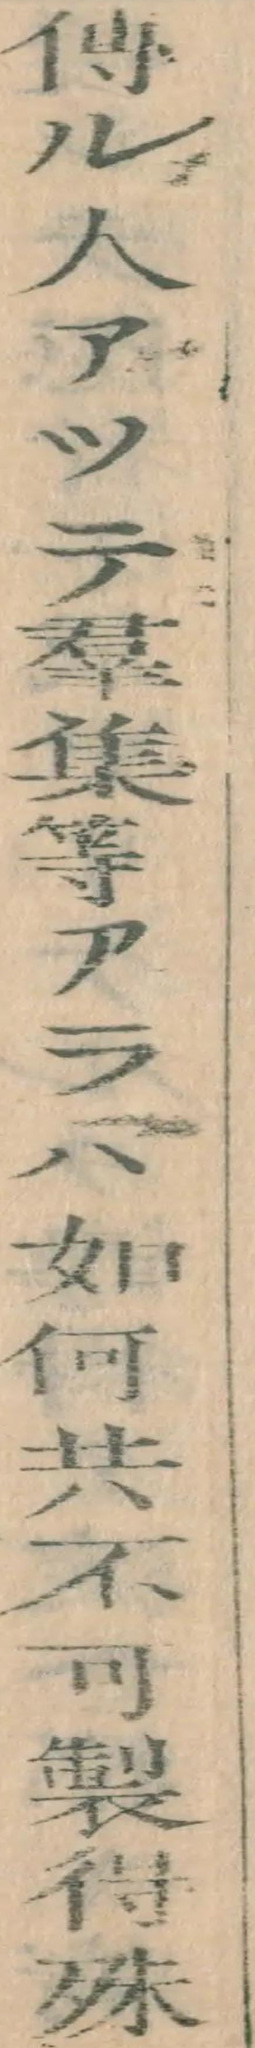伝ル人アツテ群集等アラハ如何共不可製得殊
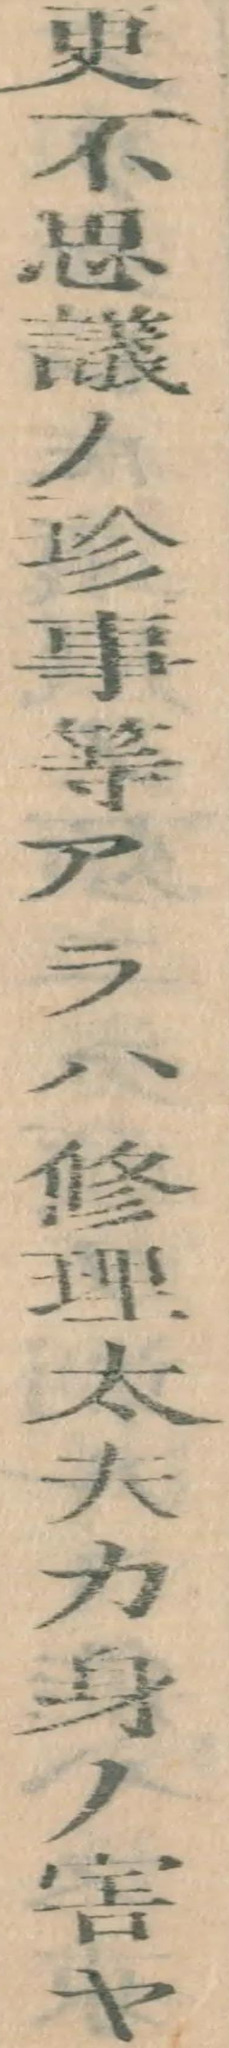更不思議ノ珍事等アラハ修理太夫カ身ノ害ヤ
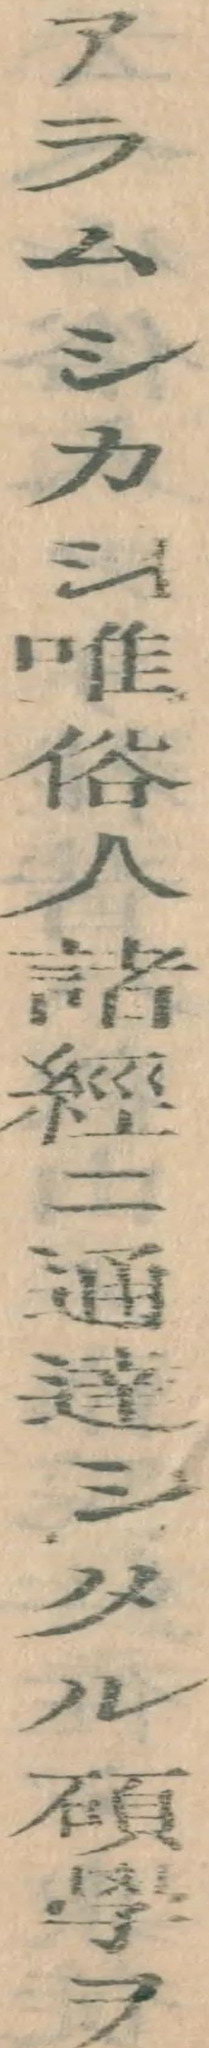アラムシカシ唯俗人諸経ニ通達シタル碩学ヲ
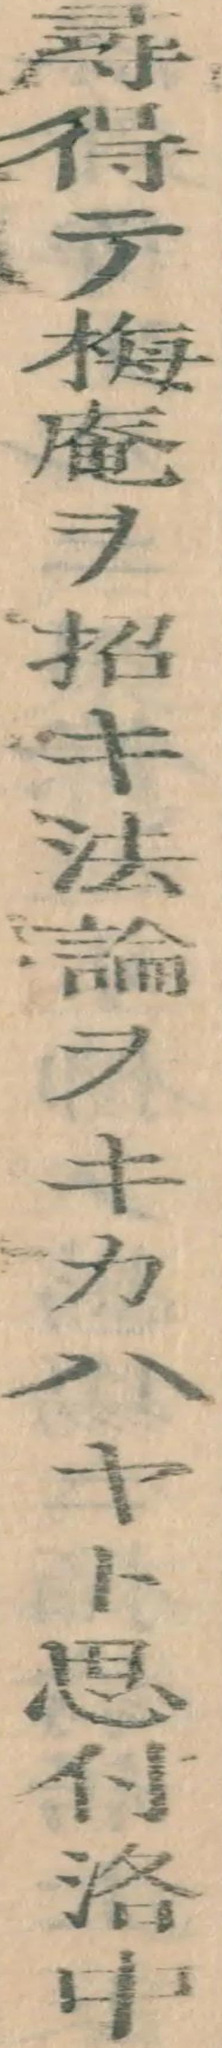尋得テ梅庵ヲ招キ法論ヲキカハヤト思付洛中

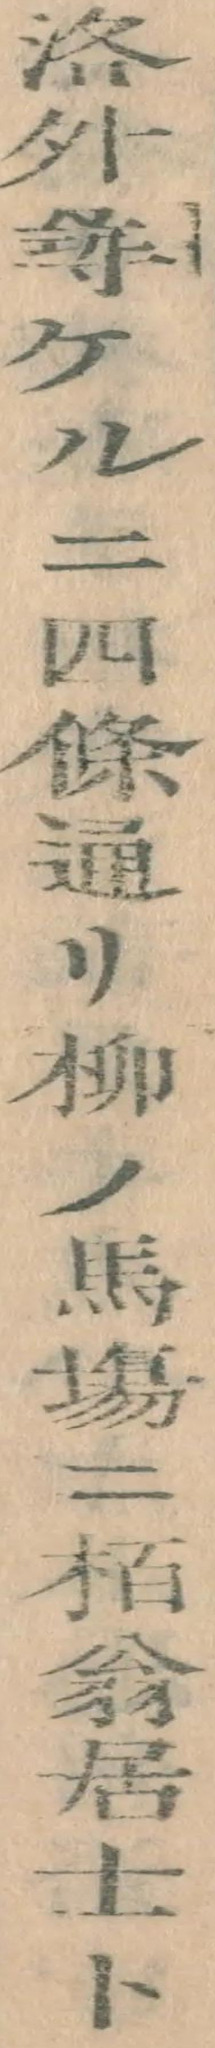洛外尋ケルニ四条通リ柳ノ馬場ニ栢翁居士ト
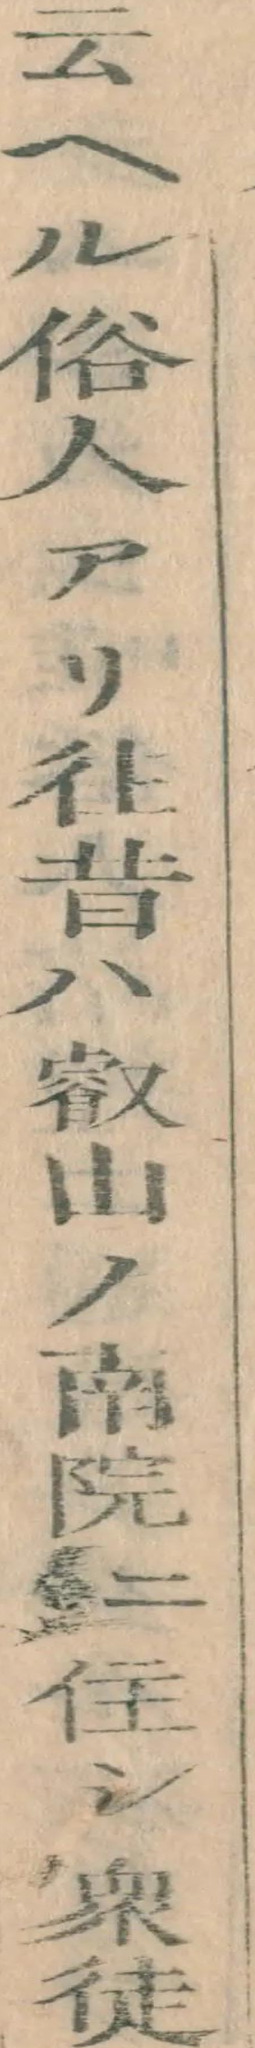云ヘル俗人アリ往昔ハ叡山ノ南院ニ住シ衆徒
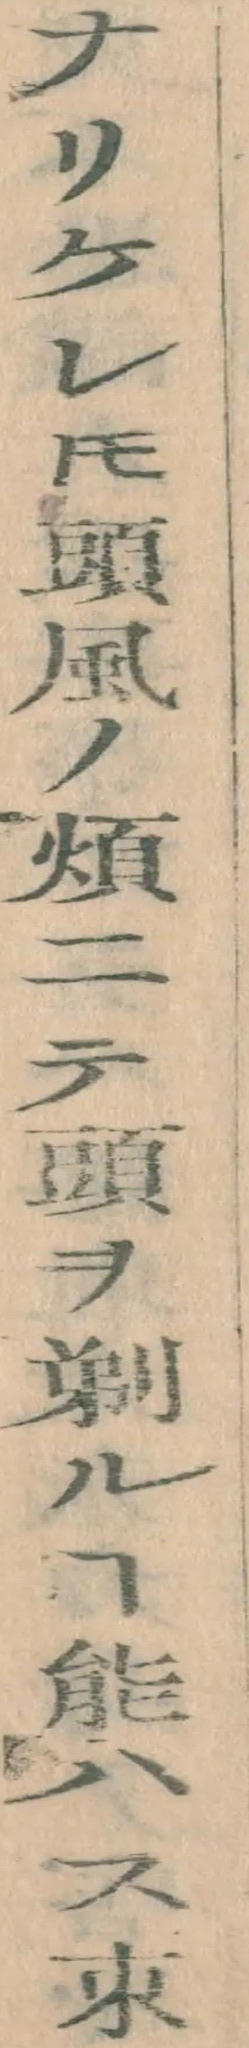ナリケレトモ頭風ノ煩ニテ頭ヲ剃ルヿ能ハス束
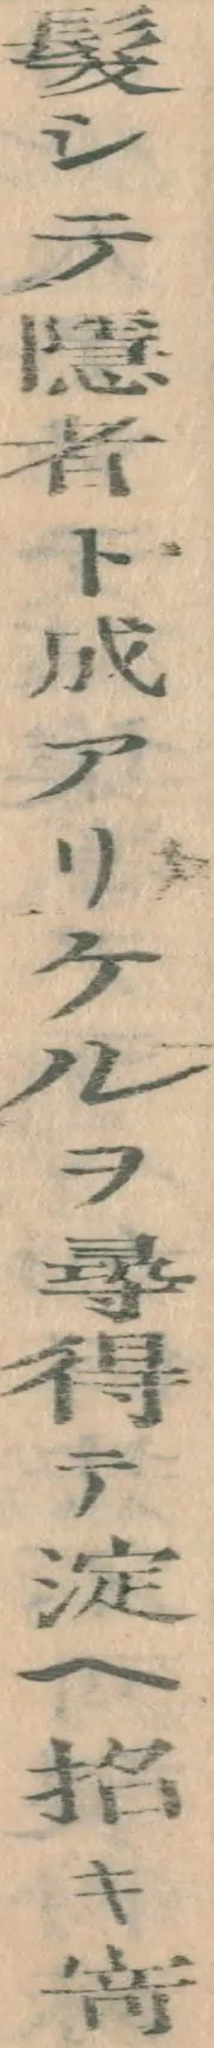髪シテ隠者ト成アリケルヲ尋得テ淀ヘ招キ寄
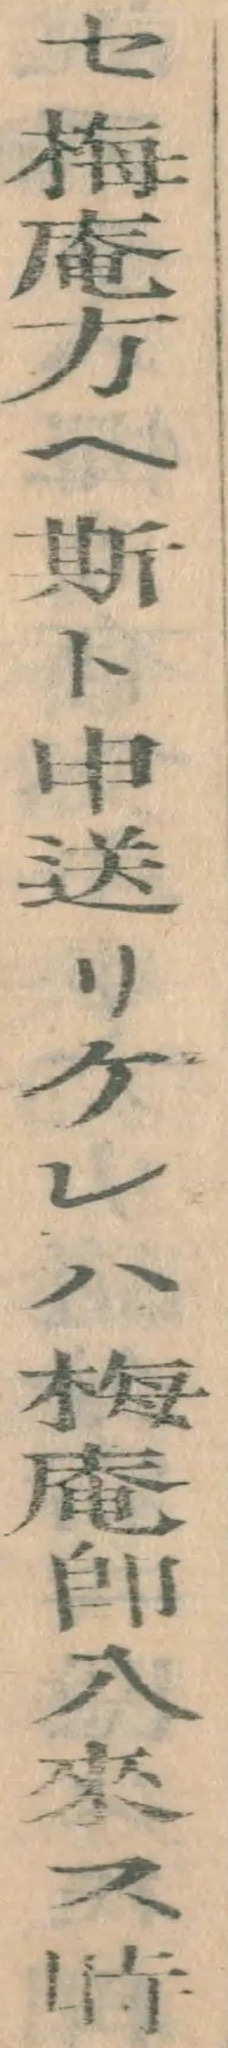セ梅庵方ヘ斯ト申送リケレハ梅庵即入来ス時
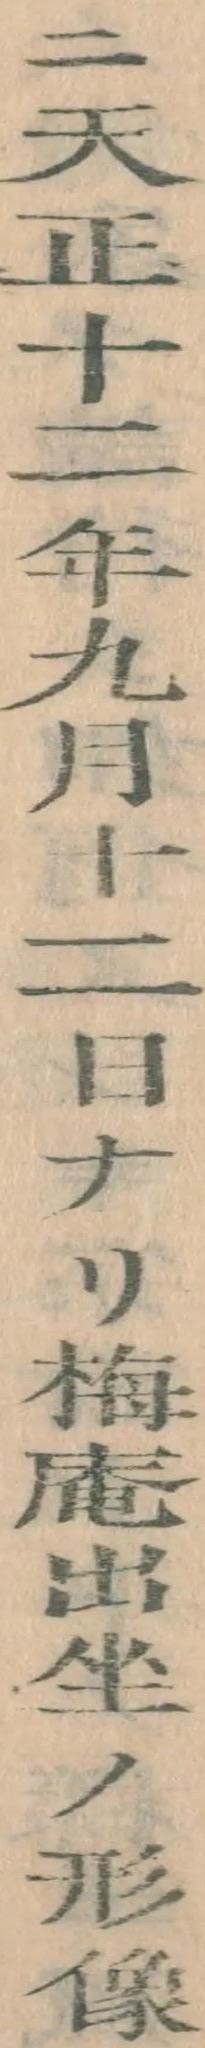ニ天正十二年九月十二日ナリ梅庵出坐ノ形像
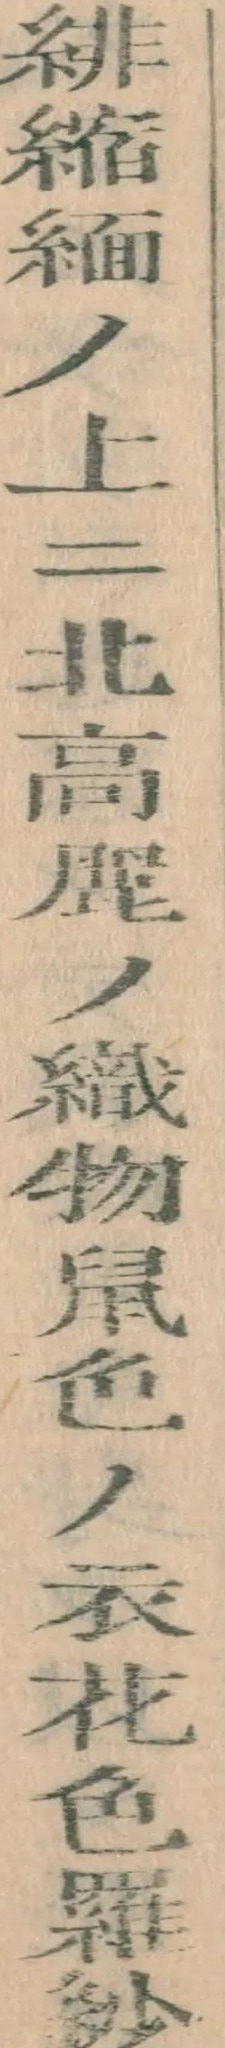緋縮緬ノ上ニ北高麗ノ織物鼠色ノ衣花色羅紗
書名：南蛮寺興廃記
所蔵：国立国会図書館 National Diet Library, JAPAN
